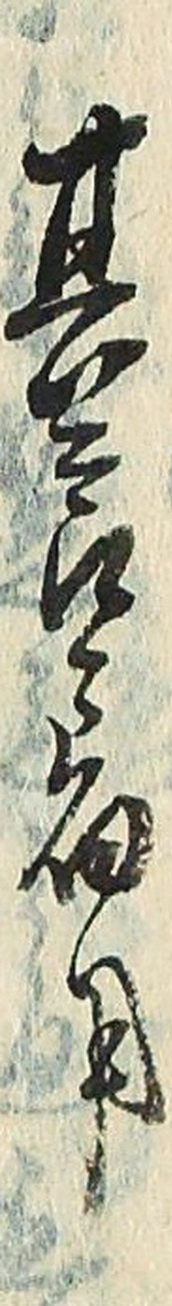其節着用
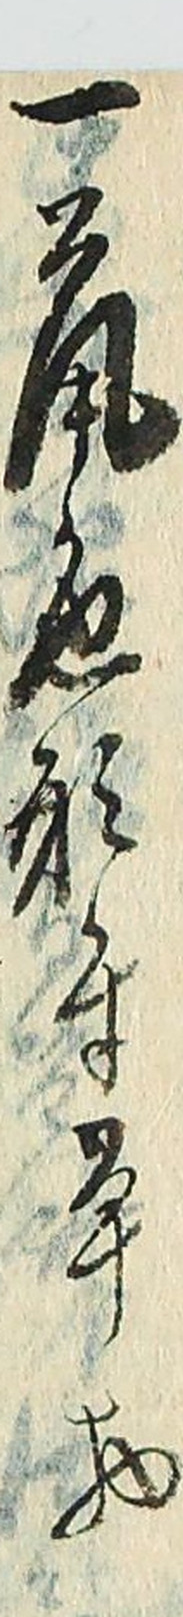一鼠色形付単物
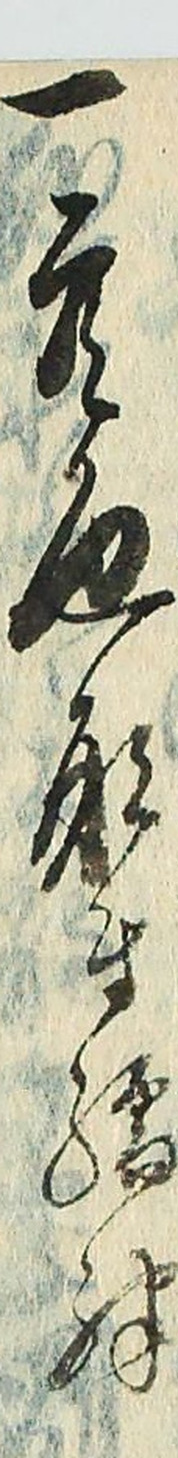一空色形付襦袢
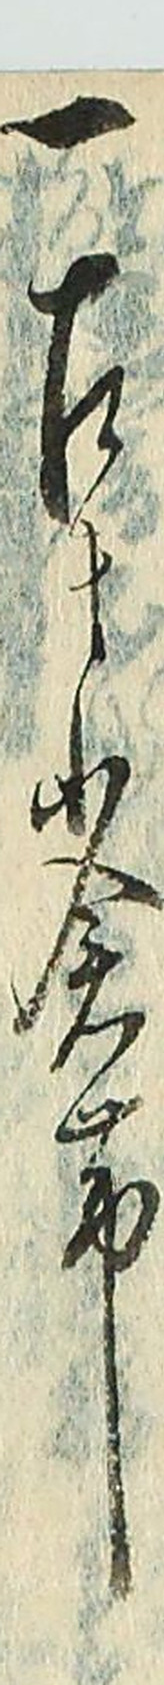一古キ小倉帯
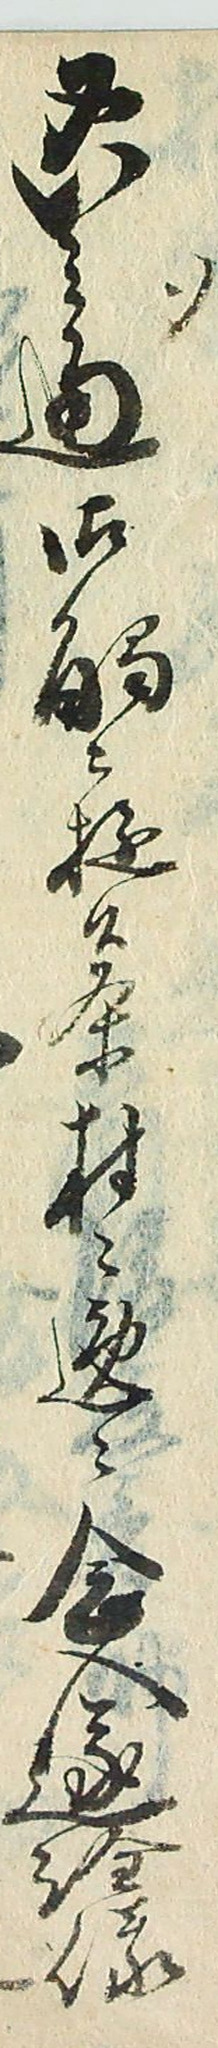右之通御触被遊候条村々逸々念入遂詮儀
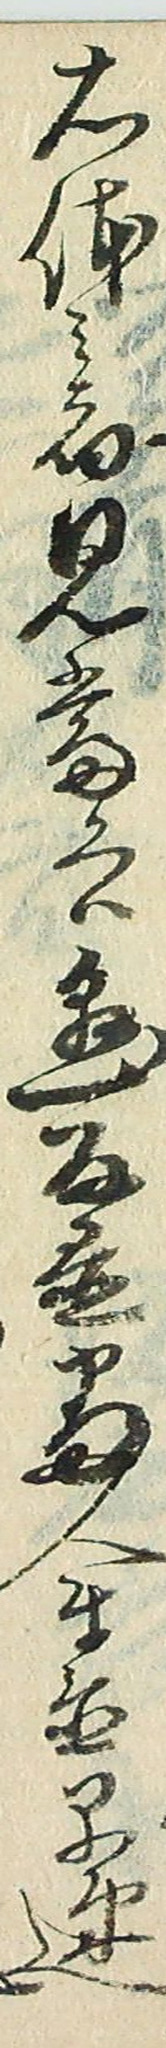右体之者見当候へは懸留置番人付置早速
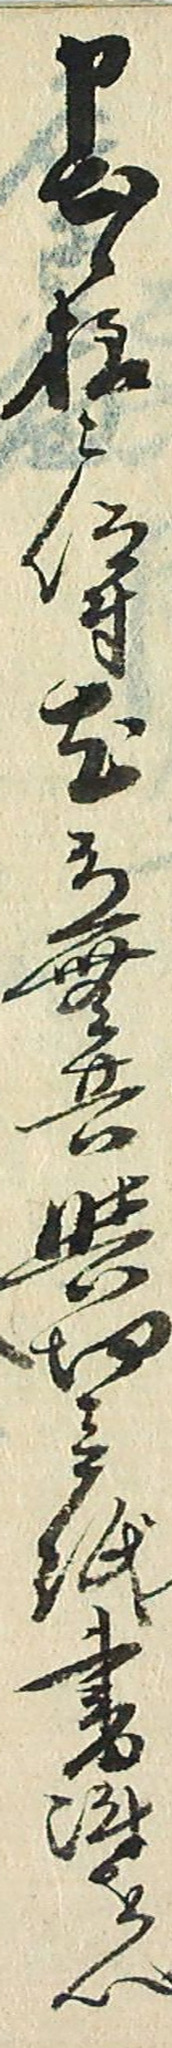申出候様被仰付尤有無共与切壱紙書附を以
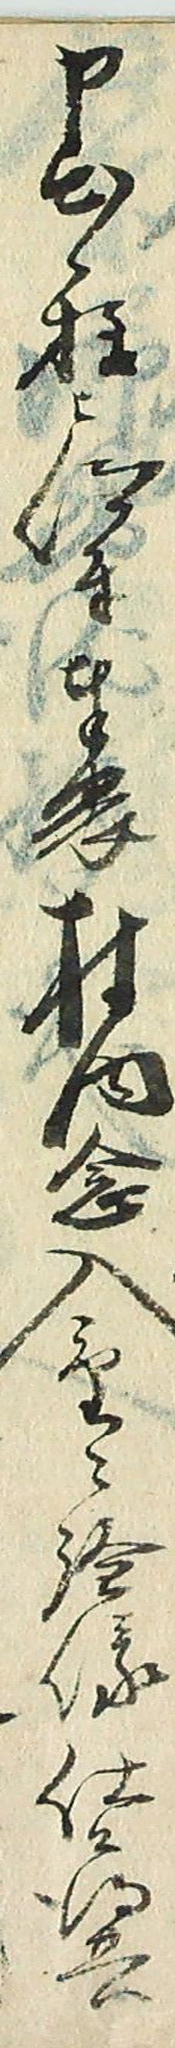申出候様被仰付奉畏村内念入重々詮儀仕候得共
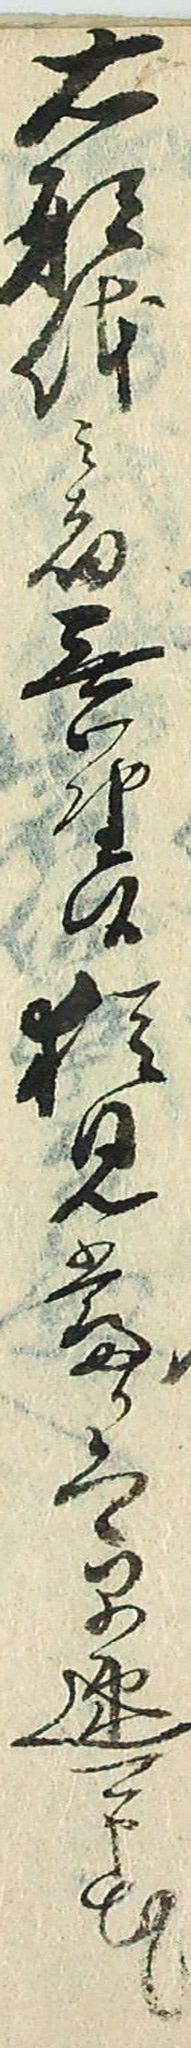右形体之者無御坐候猶見当り候はゝ早速可申出候
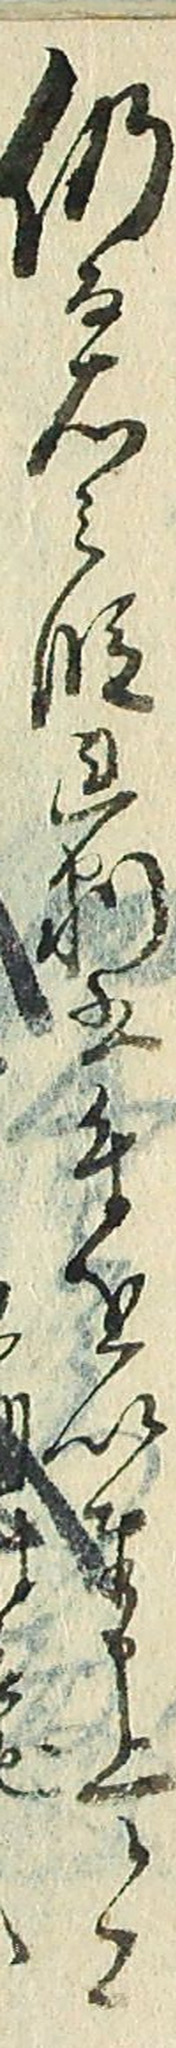仍而右之段連判書付を以奉申上候以上
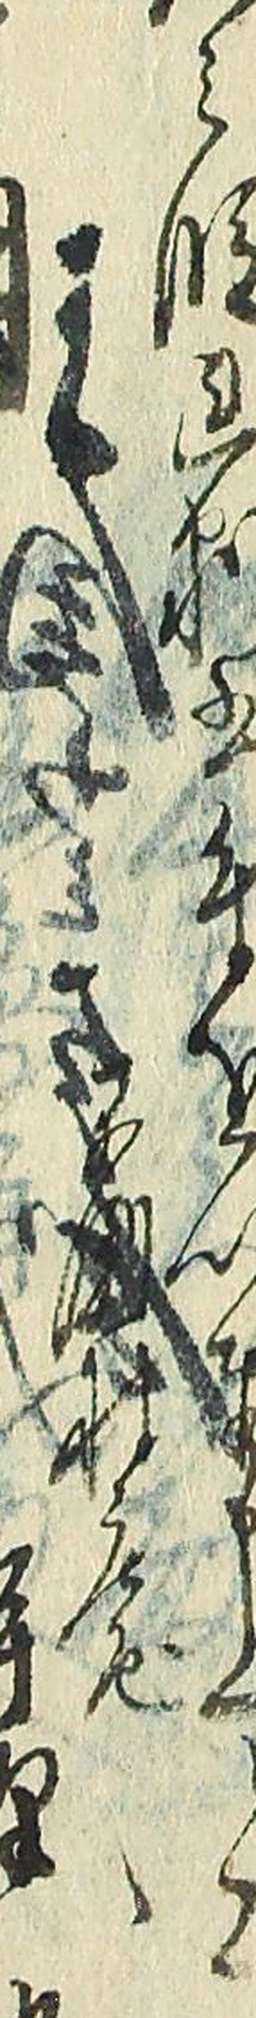早淵村庄屋
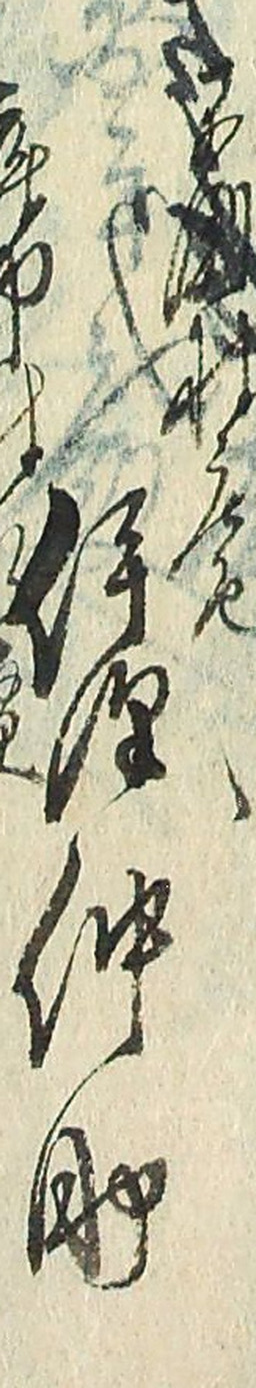伊澤仲助
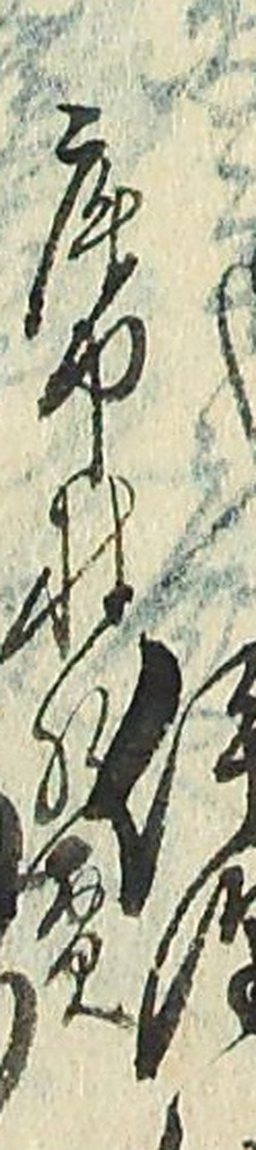府中村肝煎
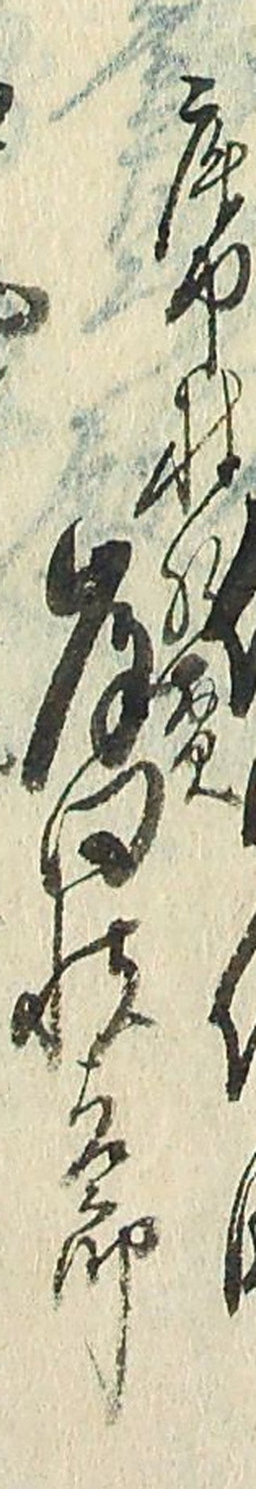岸田快吉郎
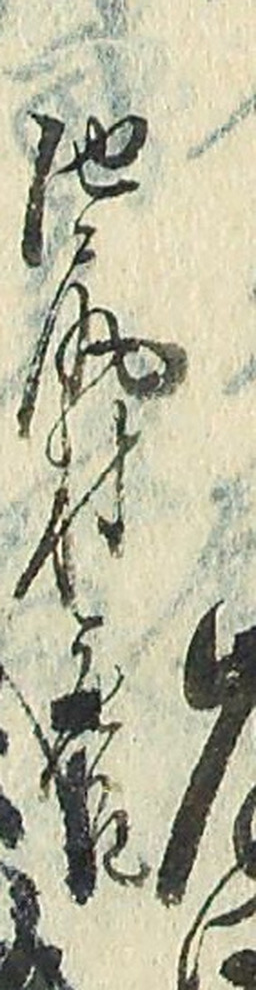池尻村庄屋
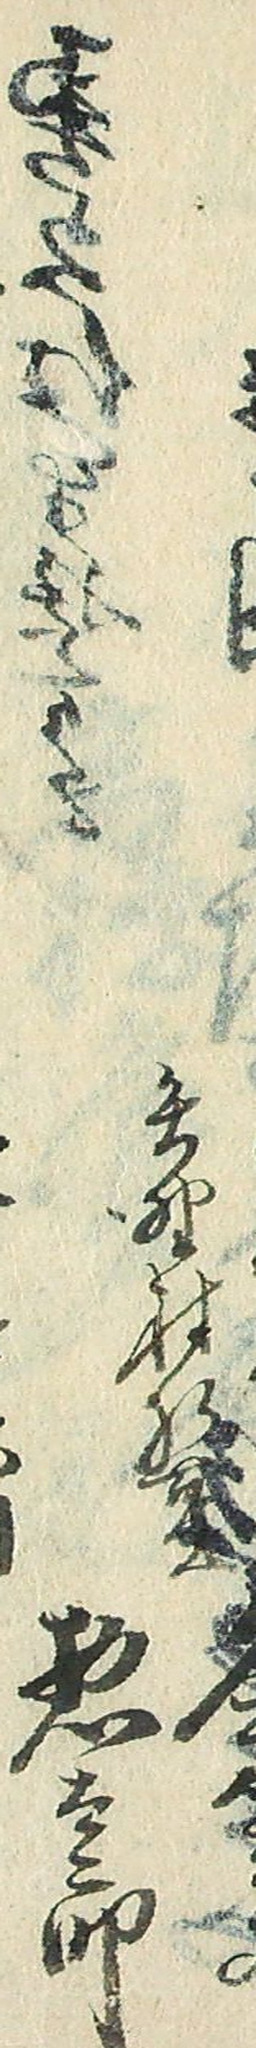惣太郎
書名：諸御用御□受書控
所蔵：鳴門教育大学 Naruto University of Education
